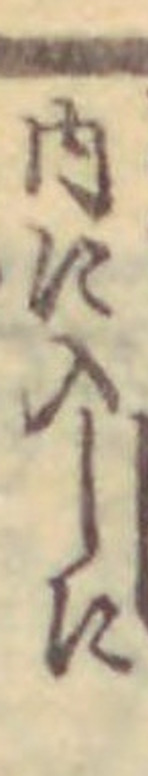内に入しに
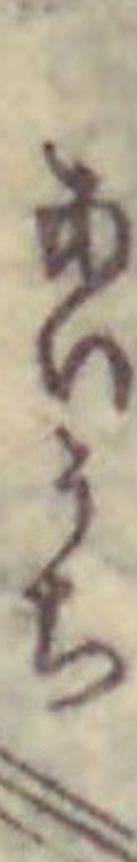あいうち
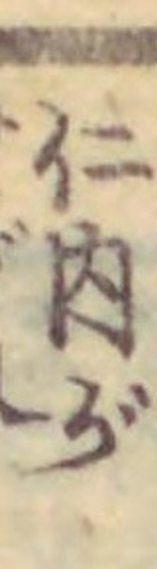仁内が
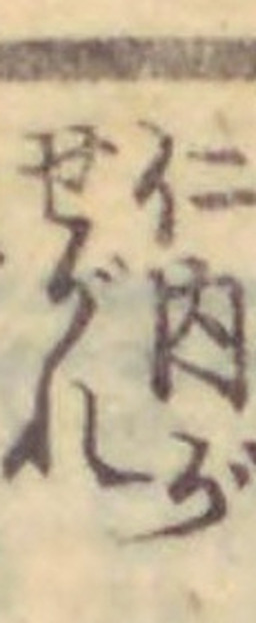せがれ
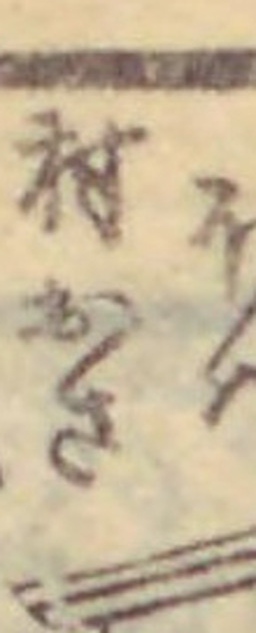村おさ
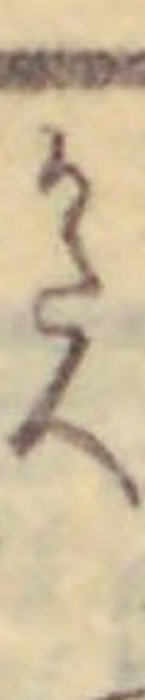かたへ
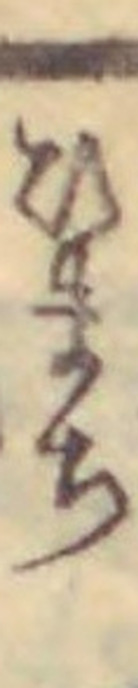ひまち
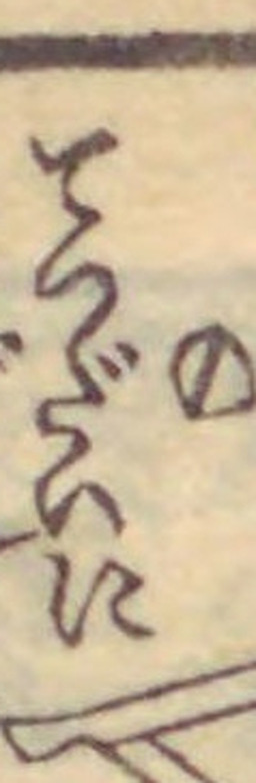てつだいに
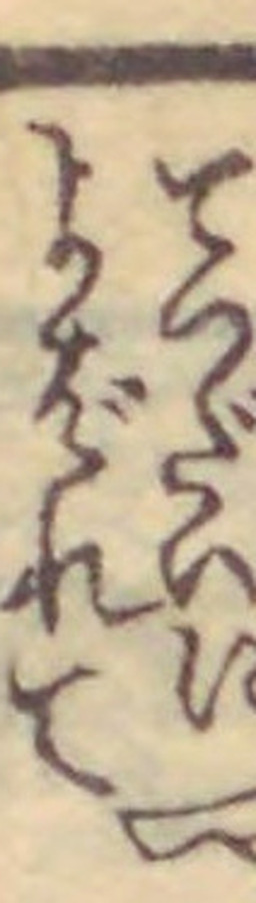よばれて
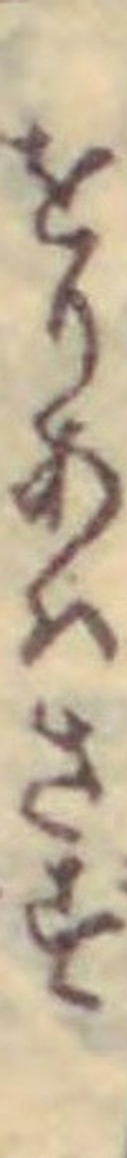をりあはさず
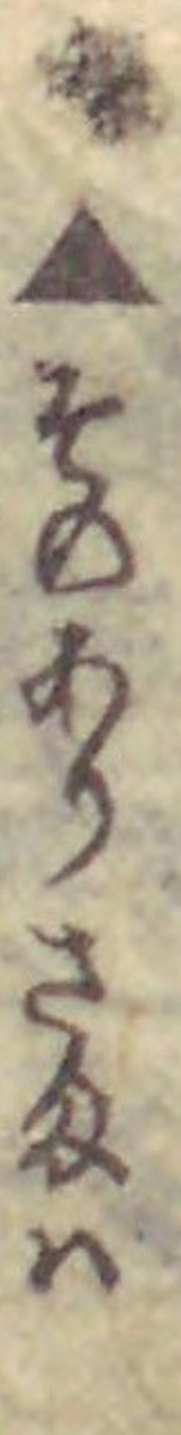▲そのありさまは
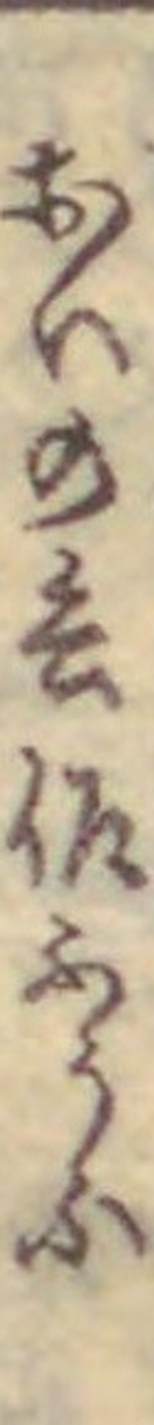おいの善作ふうふ
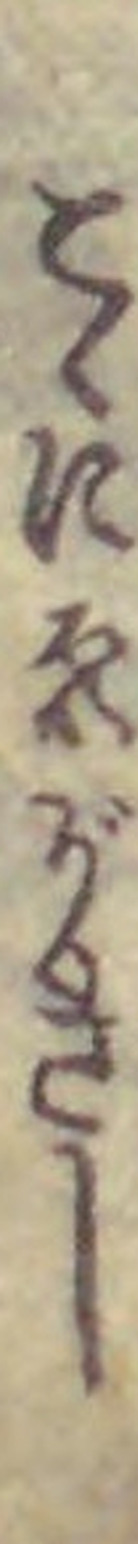こゝにゑがきし
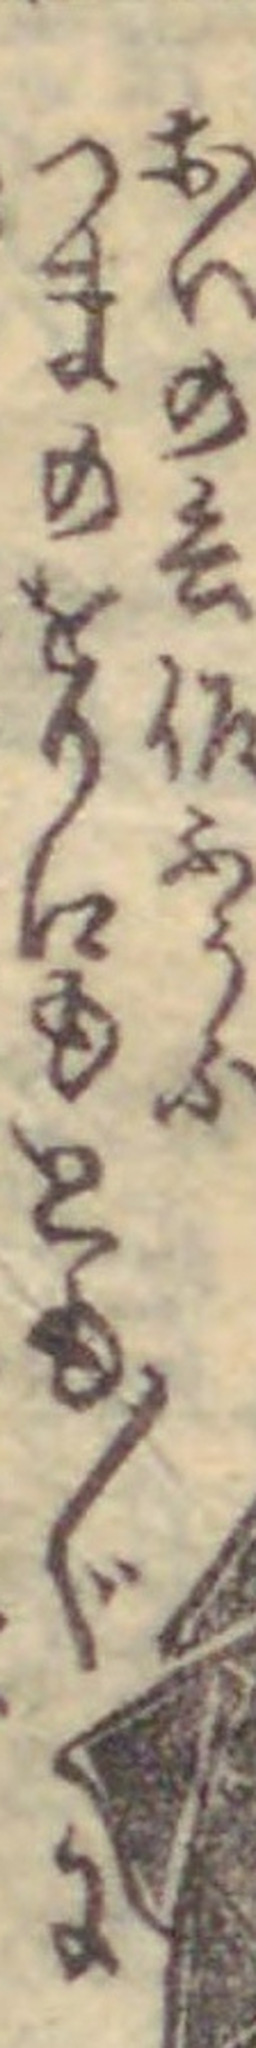つまのをり江とも〴〵に
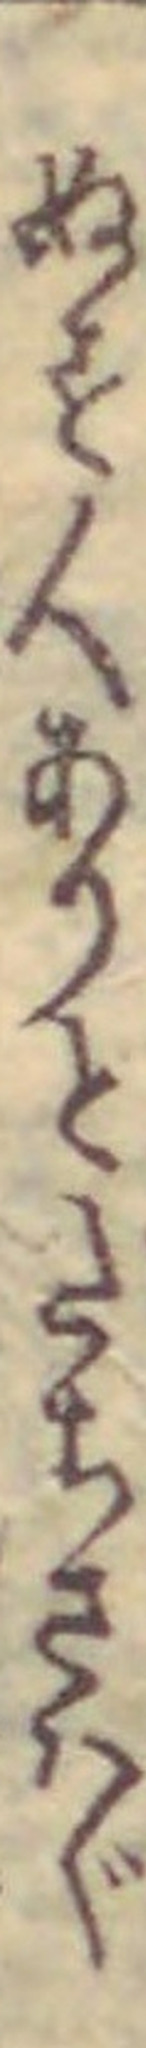ぬす人ありとたちさはぐ
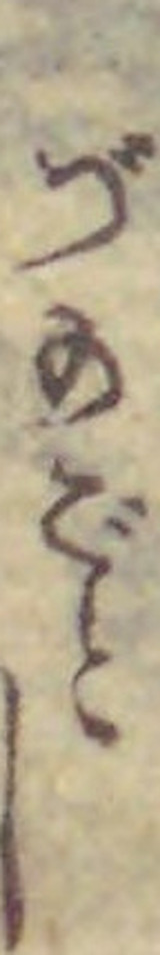づのごと
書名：八ツ目鱣因縁物語 3巻
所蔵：国立国会図書館 National Diet Library, JAPAN
